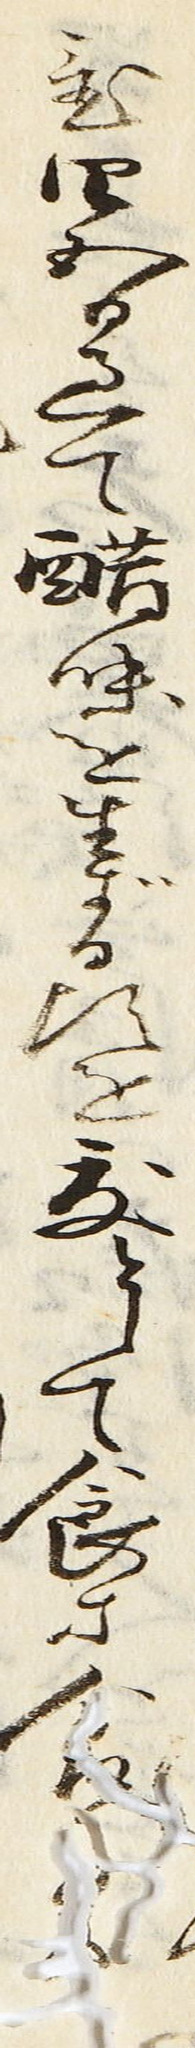置四五日過て醋味を生ずる頃を度として食す食
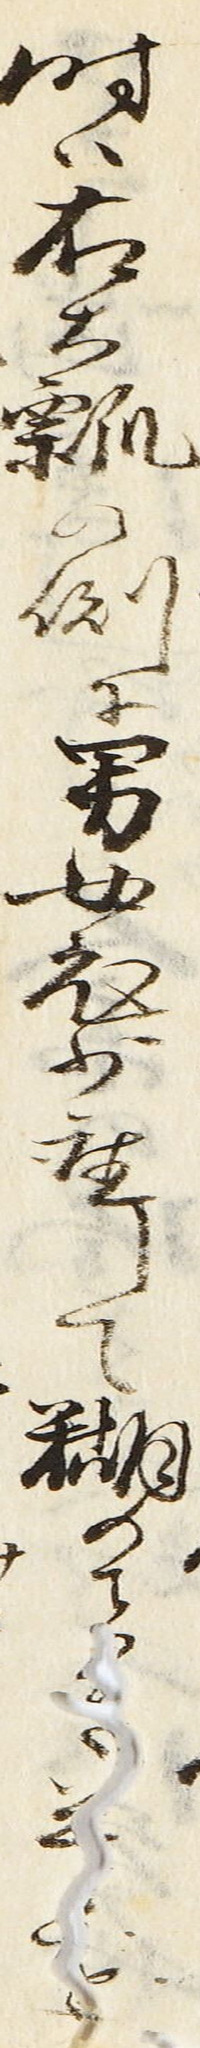時ハ右大瓢の側に男女老少座して糊のことき芋
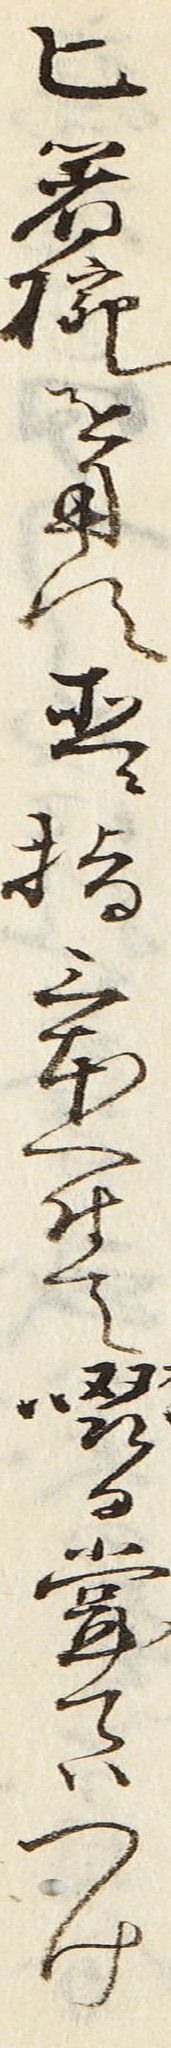匕箸椀を用す直ニ指三本へ付て啜る嘗てハつけ
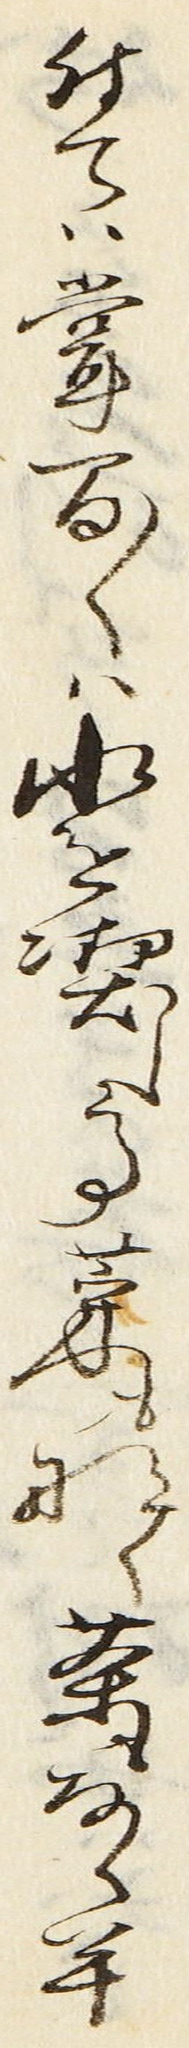付てハ嘗間〳〵ハ水を喫して菜もなく茶もなく芋
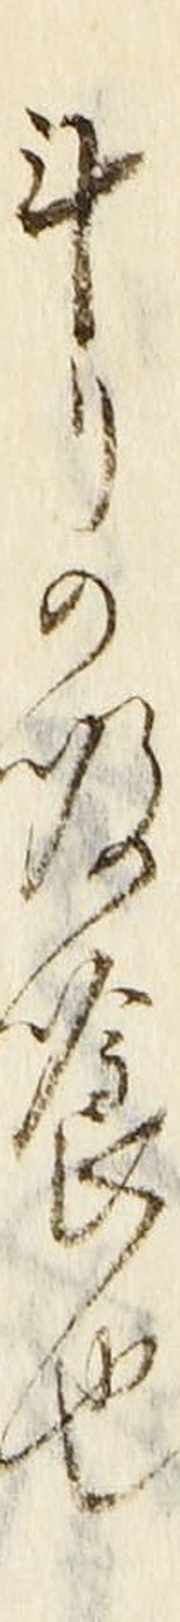計りの吸喰也
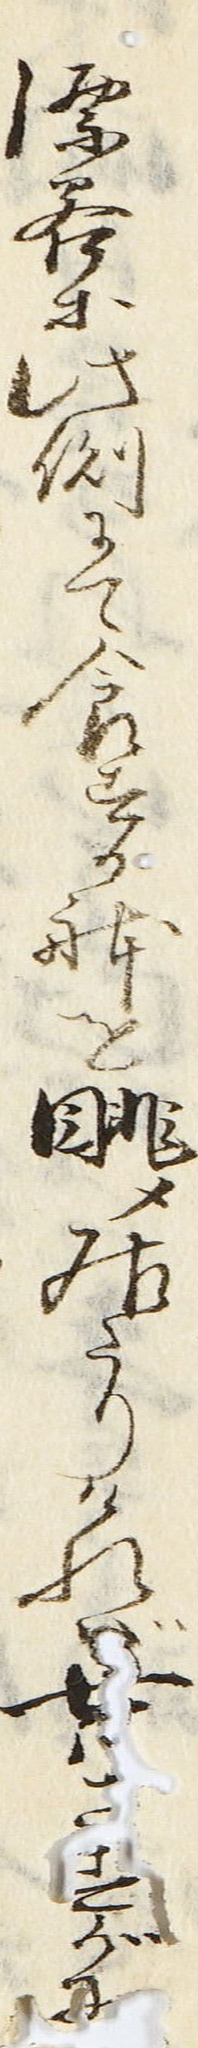漂客等此側にて食する体を眺メ居たりけれバ女ハさすがに
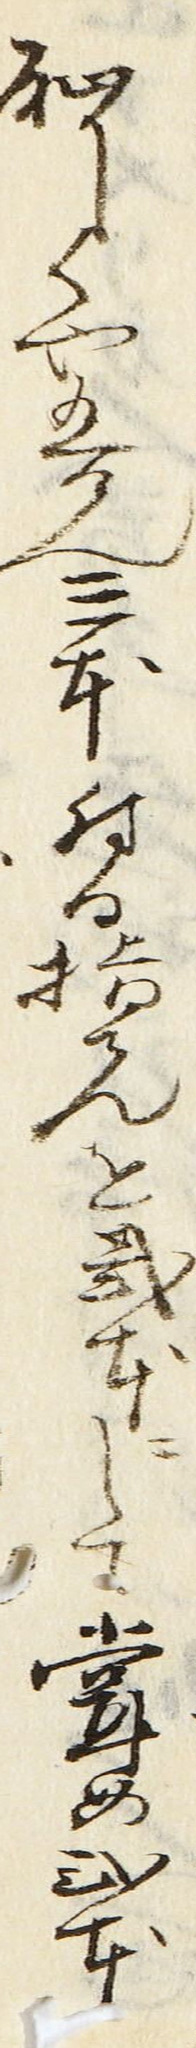恥しくや有けん三本付る指先を弐本ニして嘗め弐本
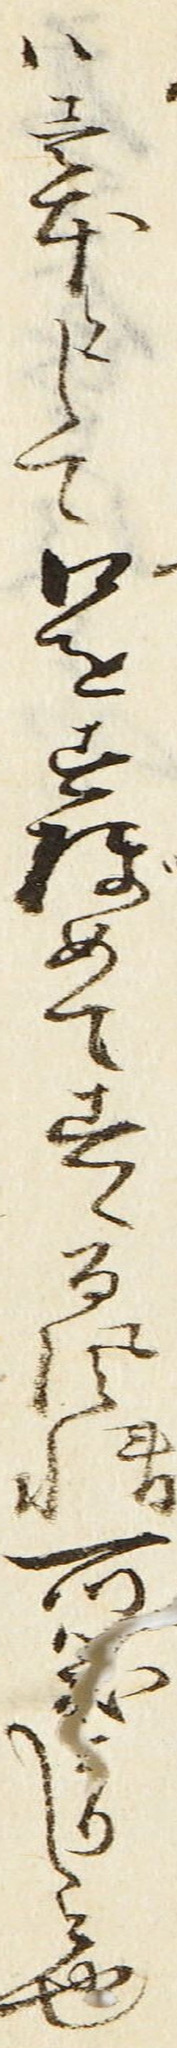ハ壱本ニして口をすぼめてすゝる風情所りしと也
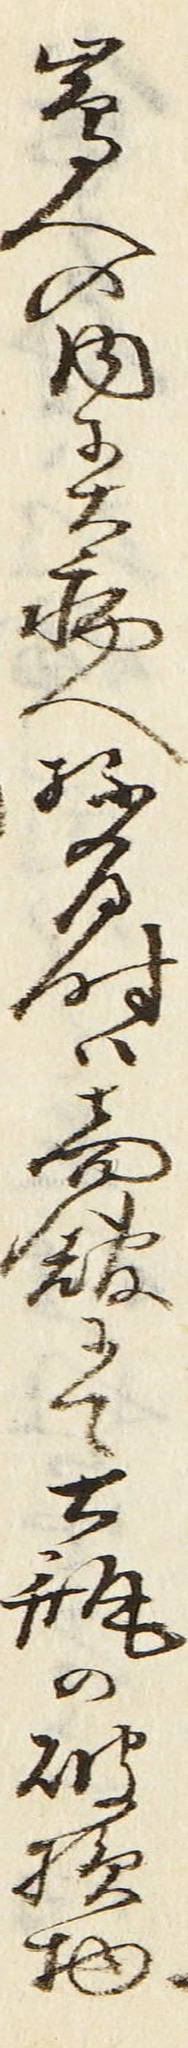島人の内に大病人抔有時ハ商館にて大瓶の破損物
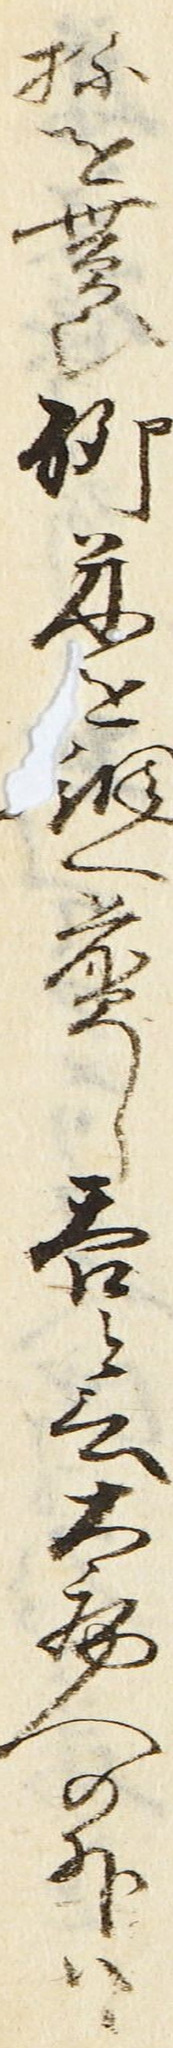抔を貰ひ聊米を調へ煎し呑と言大病人の外ハ

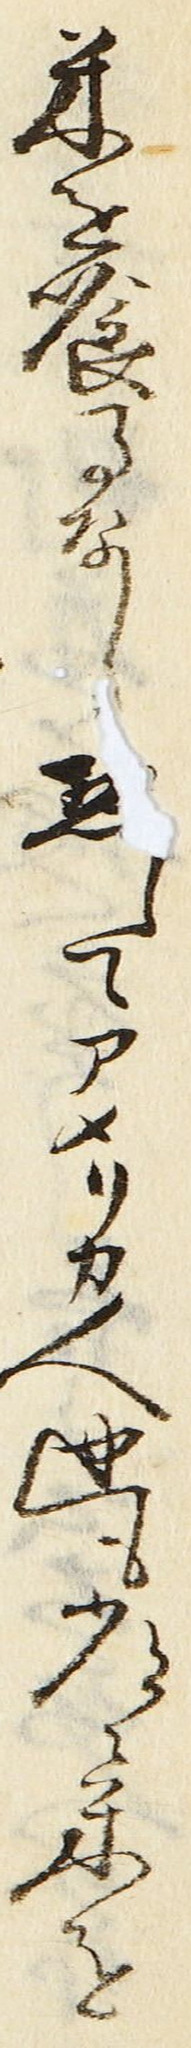米を喰事なし然してアメリカ人迚も常ニ米を
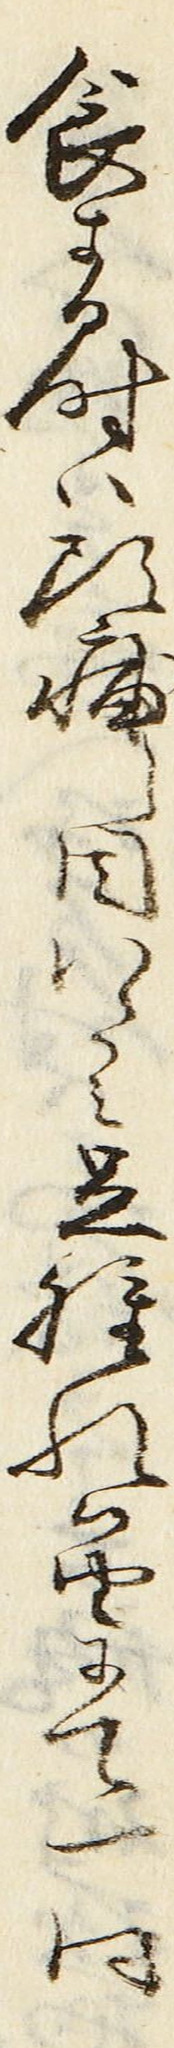食する時ハ頭痛し目いたミ足腫れ候由にて一同
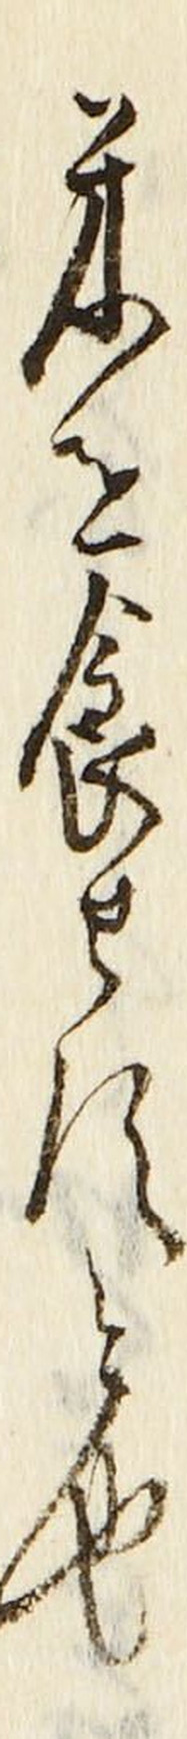米を食せすと也
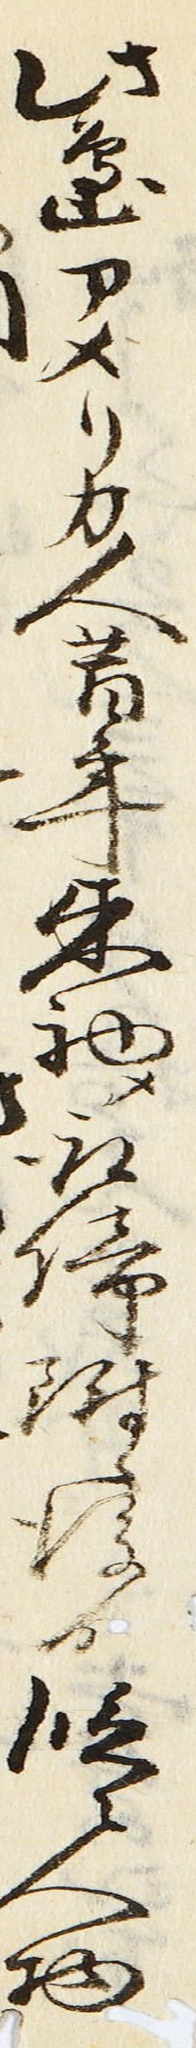此島アメリカ人昔年来初メ取締付候後日段々人物
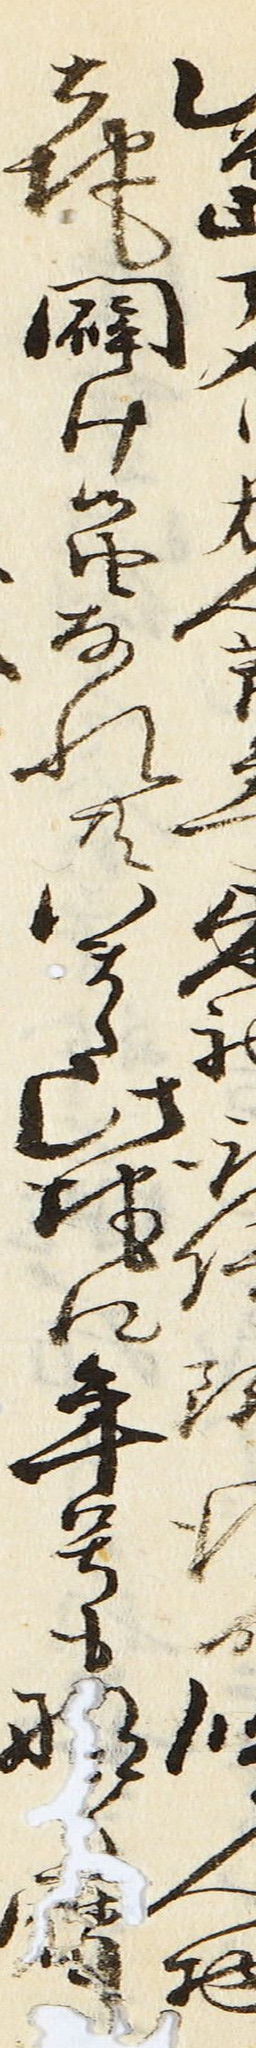土地闢け候由なれ共いまた此地に年号もなく暦
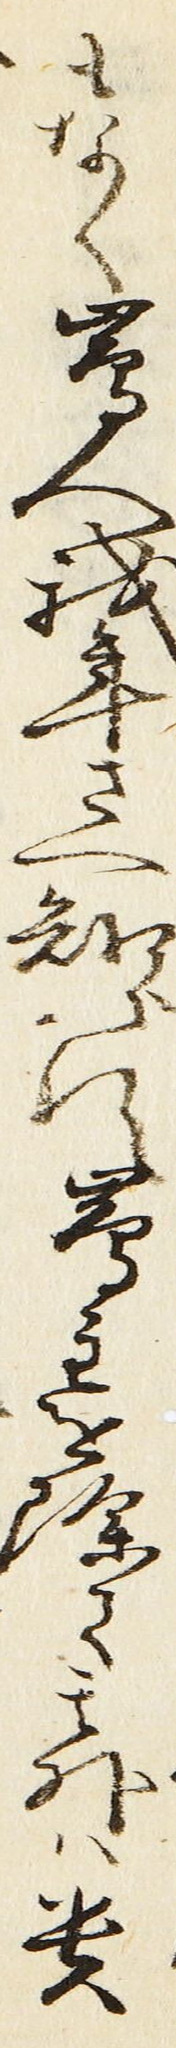もなく島人我年さへ知らす島主を除き其外ハ貴
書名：亜墨利加漂流記聞
